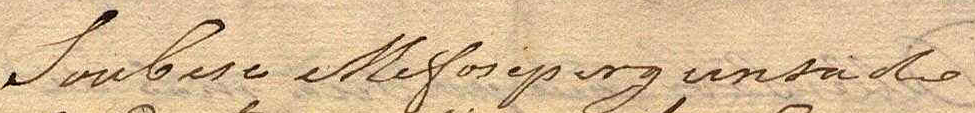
Soubese e lhe fose perguntado
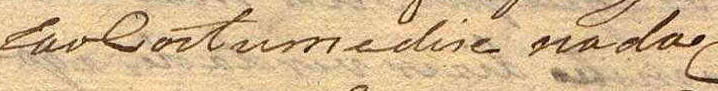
E ao Costume dise nada
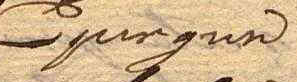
E pergun
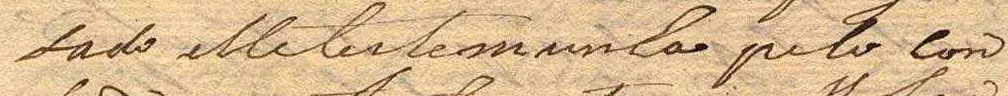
tado elle testemunha pelo Con
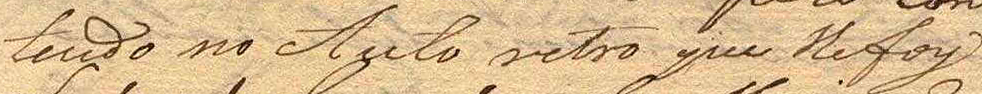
teudo no Auto retro que lhe foy
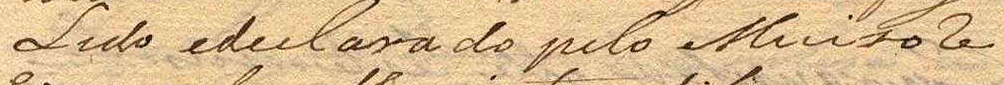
Lido e declarado pelo Muito Re
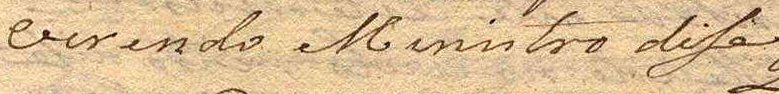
verendo Ministro dise
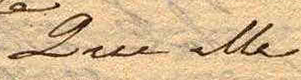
Que elle
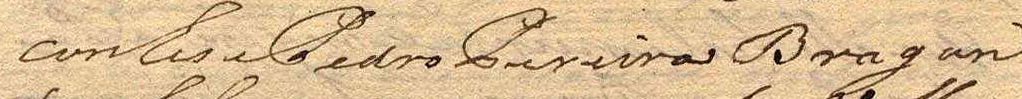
conhese Pedro Pereira Bragan
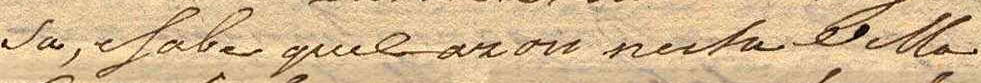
sa, e sabe que cazou nesta villa
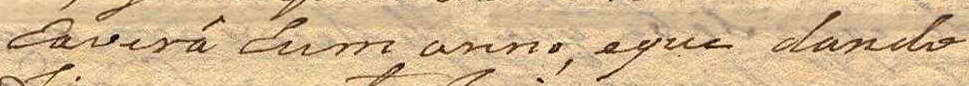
haverá hum anno, e que dando
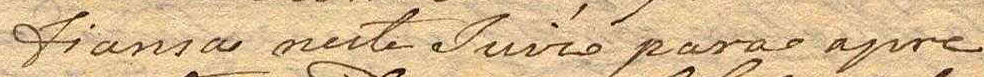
fiansa neste Juizo para apre
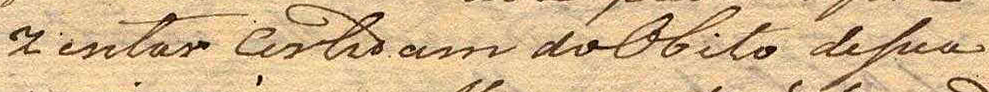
zentar certidam do Obito de sua
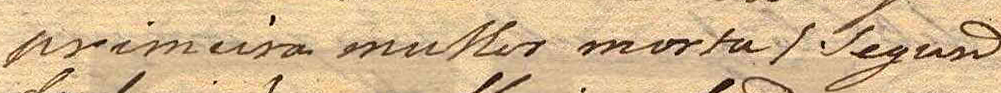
primeira mulher morta / Segun
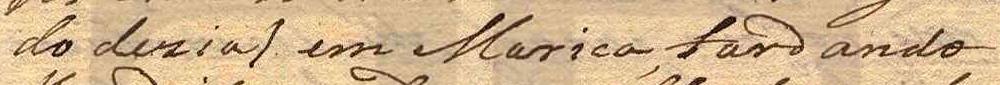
do dezia / em Marica tardando
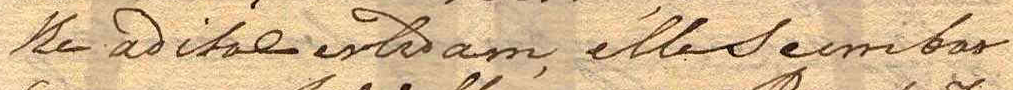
lhe a dita Certidam elle Se embar
